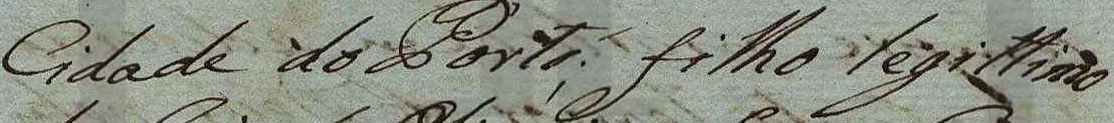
Cidade do Porto; filho legittimo
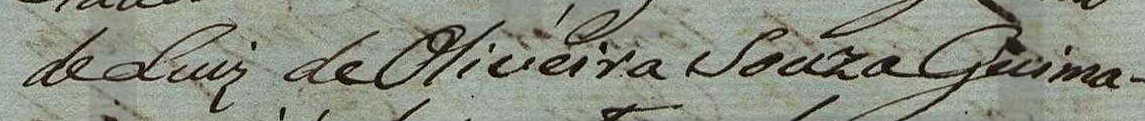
de Luiz de Oliveira Souza Guima
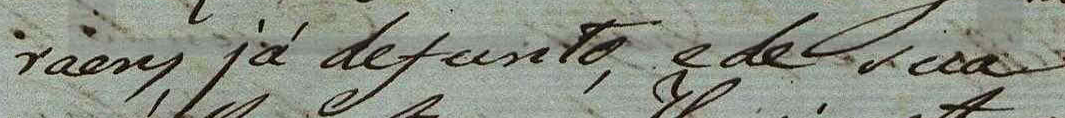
raens, já defunto, e de sua
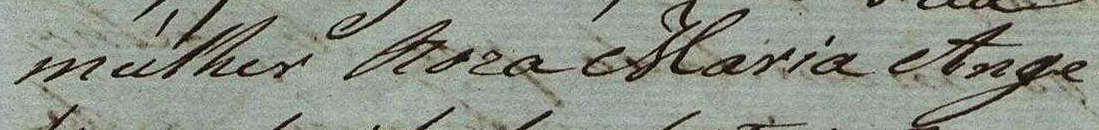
mulher Roza Maria Ange
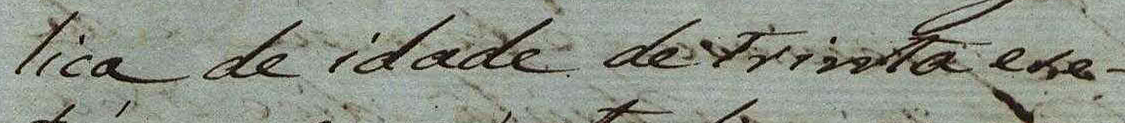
lica, de idade de trinta e se
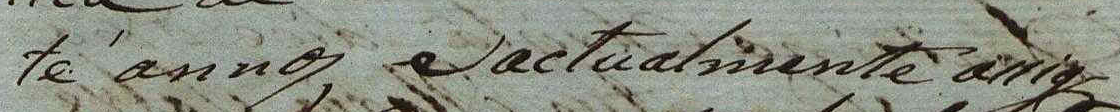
te annos e actualmente assig
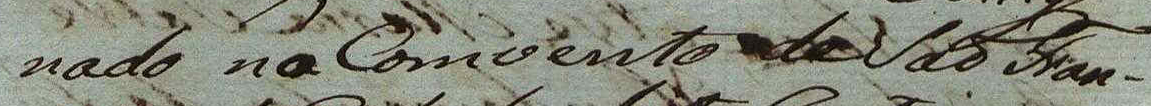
nado no Comvento de Saõ Fran
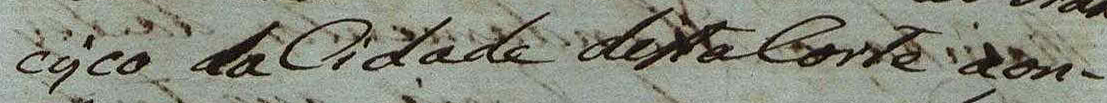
cisco da Cidade desta Corte aon
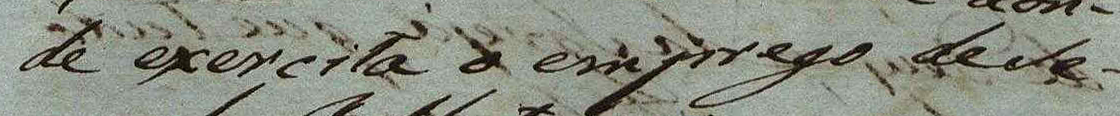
de exercita o emprego de se
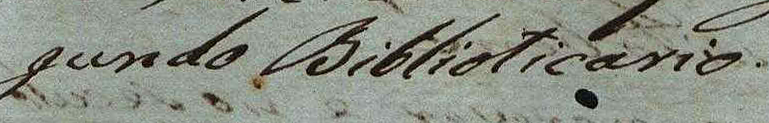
gundo Biblioticario.
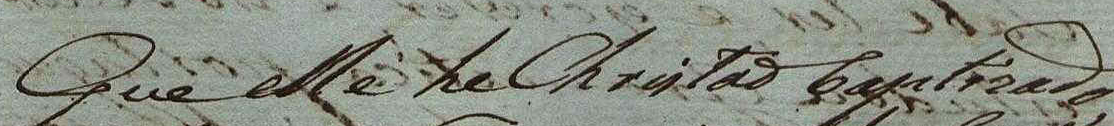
Que elle he Christaõ baptizado,
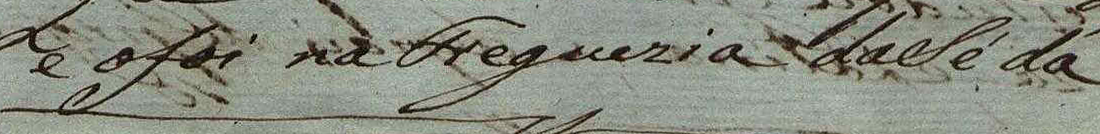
e o foi na Freguezia da Sé da
